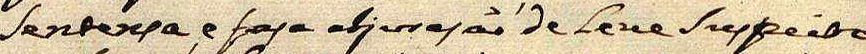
sentensa, e fasa abjurasaõ de leue suspeito
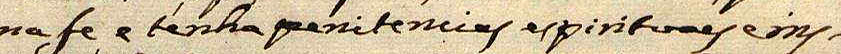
na fe, e tenha penitencias espirituaes e ins
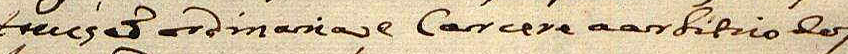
truçaõ ordinaria, e Carcere a arbitrio dos
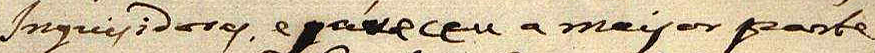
Jnquisidores, e pareceu a mayor parte
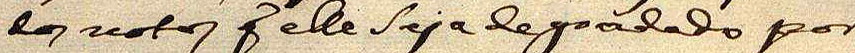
dos uotos q̄ elle seja degradado por
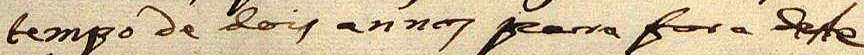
tempo de dois annos para fora deste
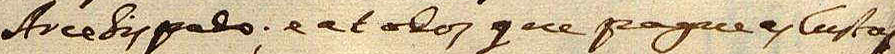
Arcebispado; e a todos que pague as Custas
